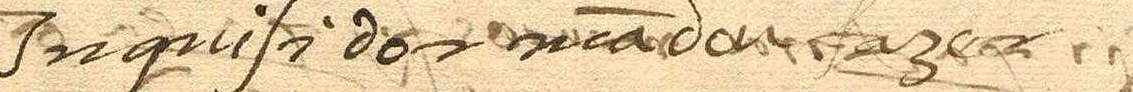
Inquisidor mādou fazer
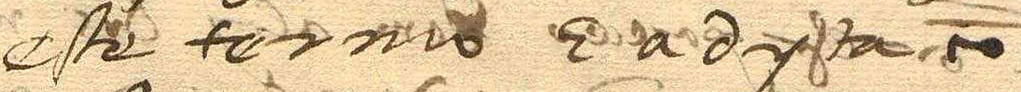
este termo E a dyta cō
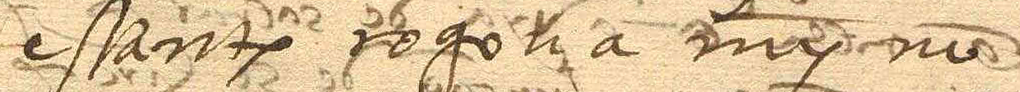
fessante rogou a mȳ no
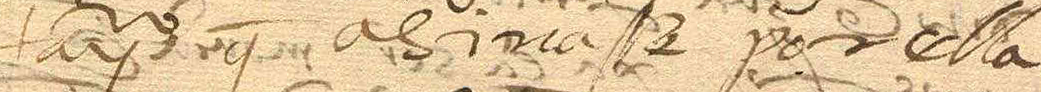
tayro q̄ asinase por ella
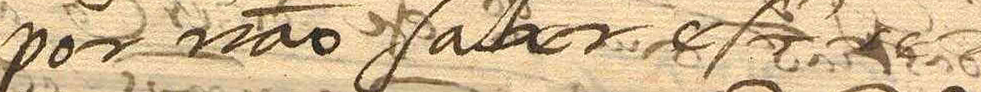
por não saber esc̄ver
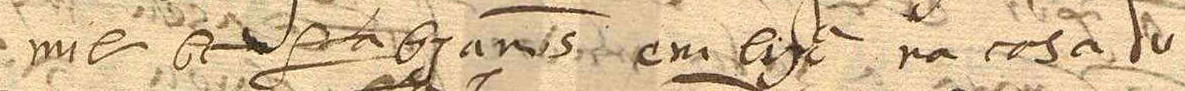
mil bcLtabj an̄os em lixa na casa do
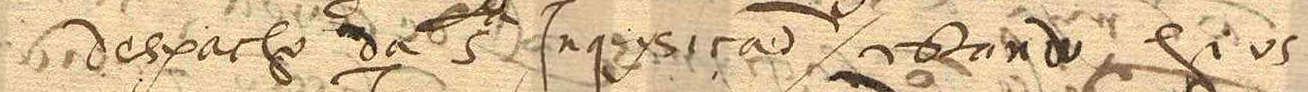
despacho da sta Jnquysição estando hi os
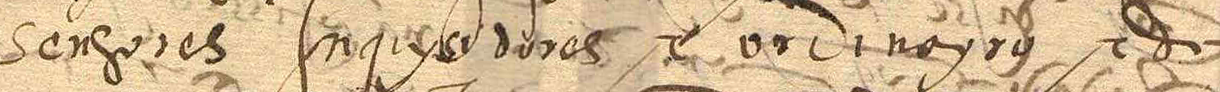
senhores Jnquysidores e ordinayro e de
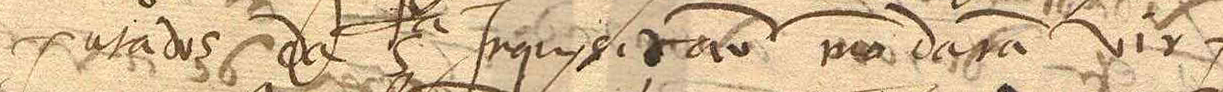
putados da sta Jnquysição mādarā vyr ꝑ
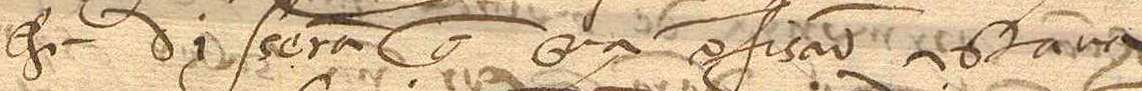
lhe disserā q̄ sua cōfisão estaua
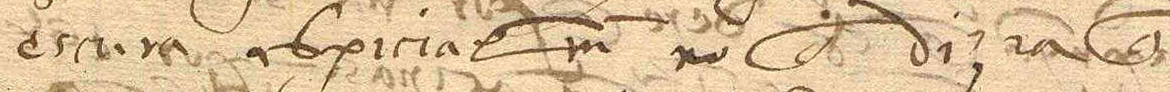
escura espicialmente no q̄ dizia q̄
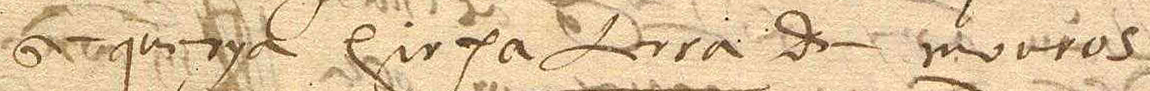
se querya hir ꝑa terra de mouros
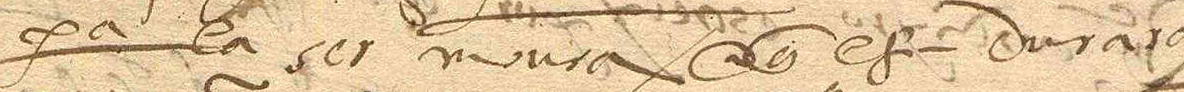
ꝑa la ser moura e q̄ ese durara
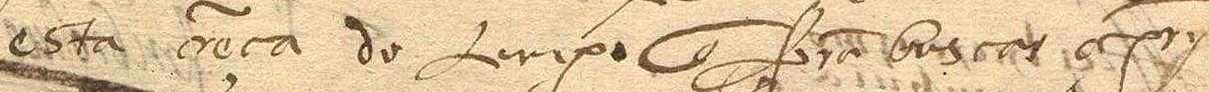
esta crẽça do tempo q̄ forā buscar a prȳ
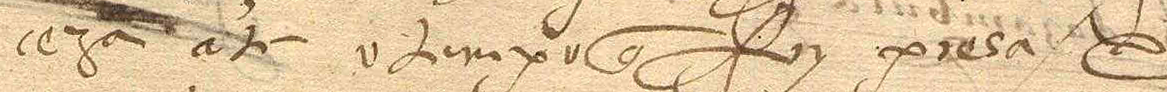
ceza ate o tempo q̄ foy presa e
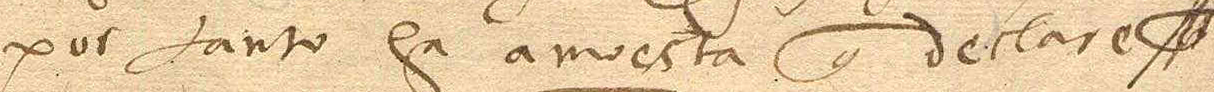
portanto ha amoesta q̄ declare _
